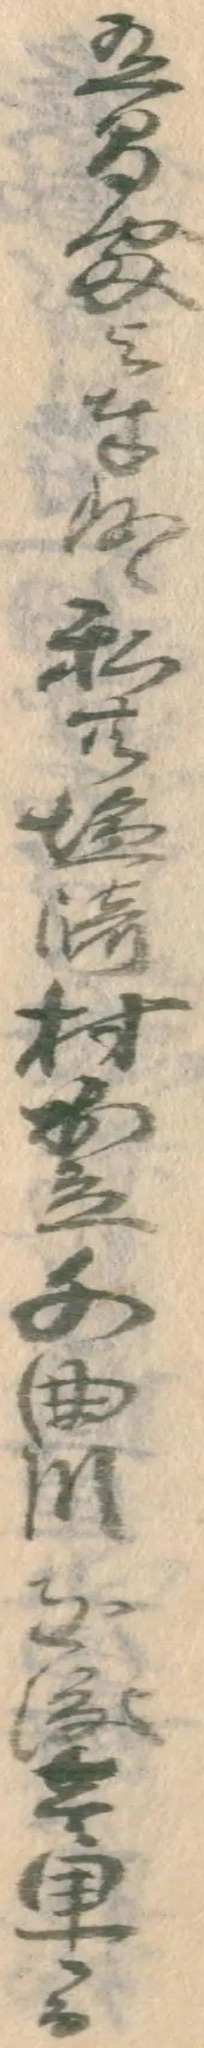有間敷と奉存候私共塩崎村出立千曲川ヲ渡壱里ニ而
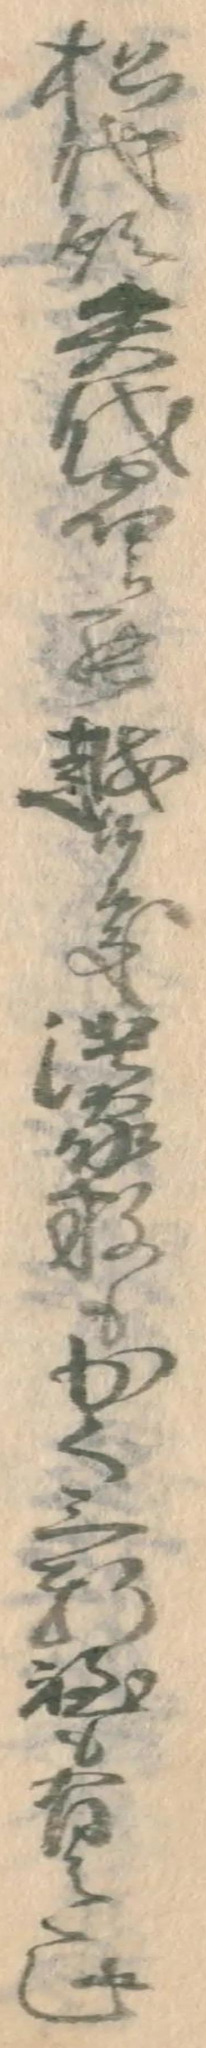松代領矢代宿江罷越候処潰家数も少く三軒程も有之候趣
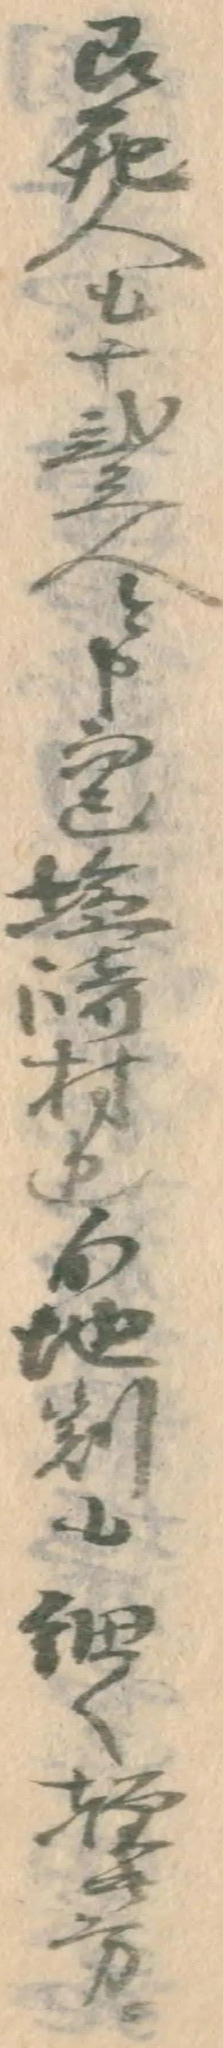即死人も十弐三人と申而已塩崎村辺ゟ地割も細く軽キ様方ニ

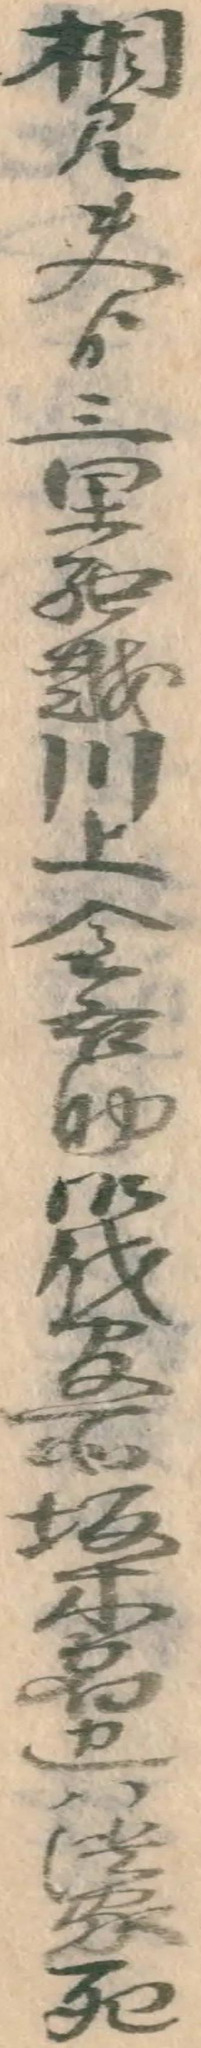相見夫ゟ三里罷越川上金吾助御代官所坂木宿辺ハ潰家死
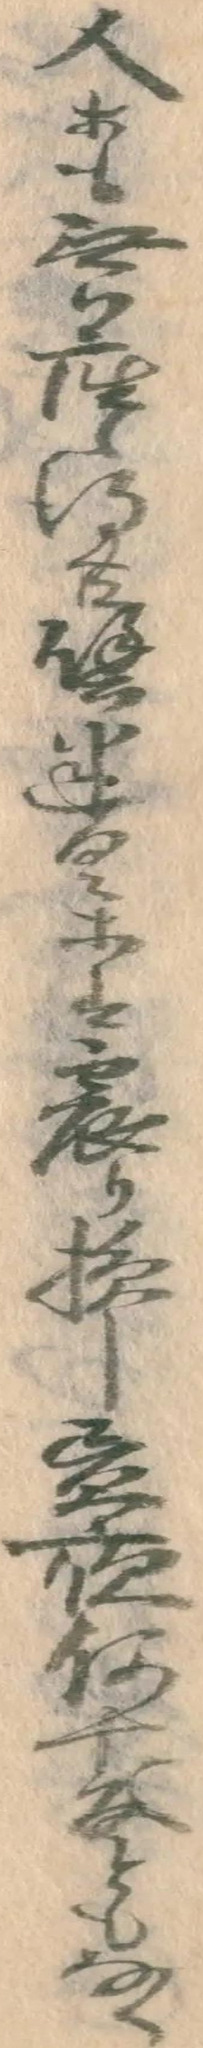人等も無御座候得共都而建具等は震り損し昼夜何十度ともなく
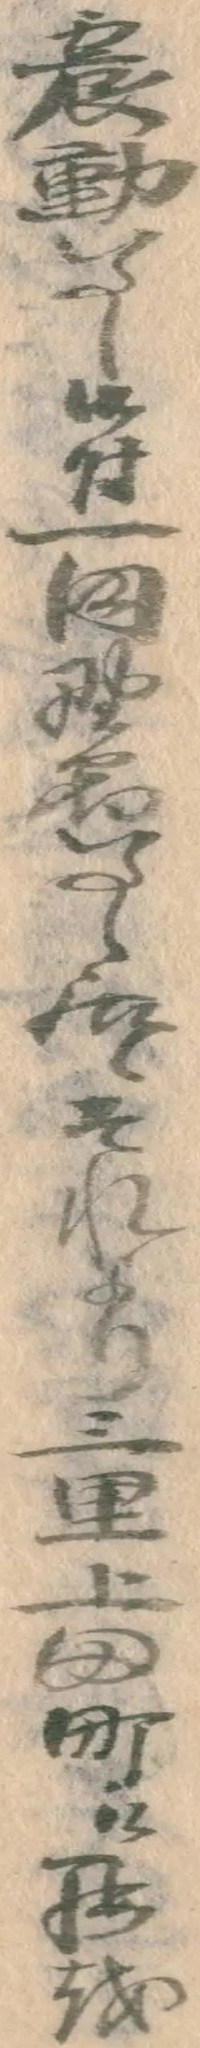震動いたし候二付一同野宿いたし居候それより三里上田町江罷越
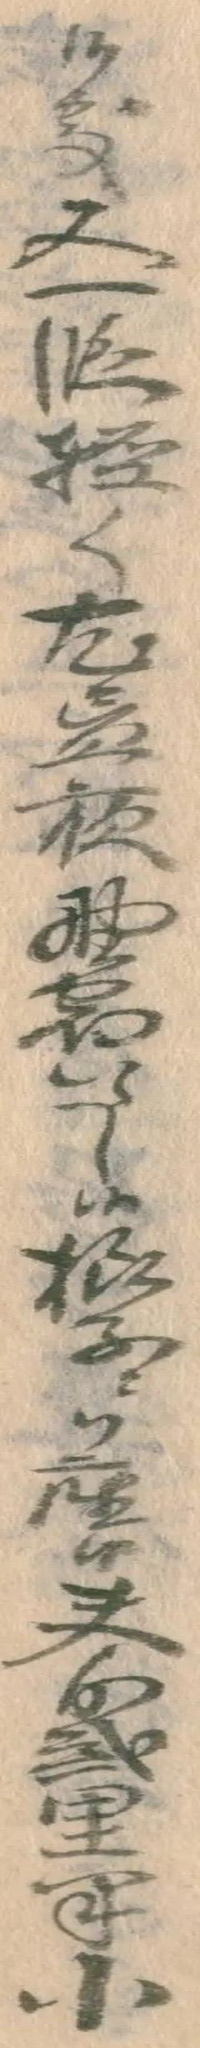候処又一段軽く尤昼夜野宿いたし候候様子ニ御座候夫ゟ弐里半小
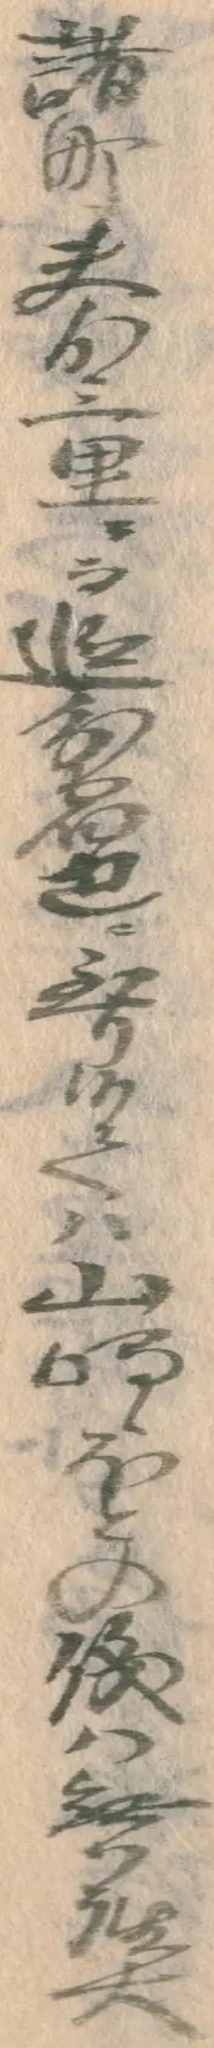諸町夫ゟ三里ニ而追分宿辺ニ至り候てハ山鳴候ほとの義ハ無御座大
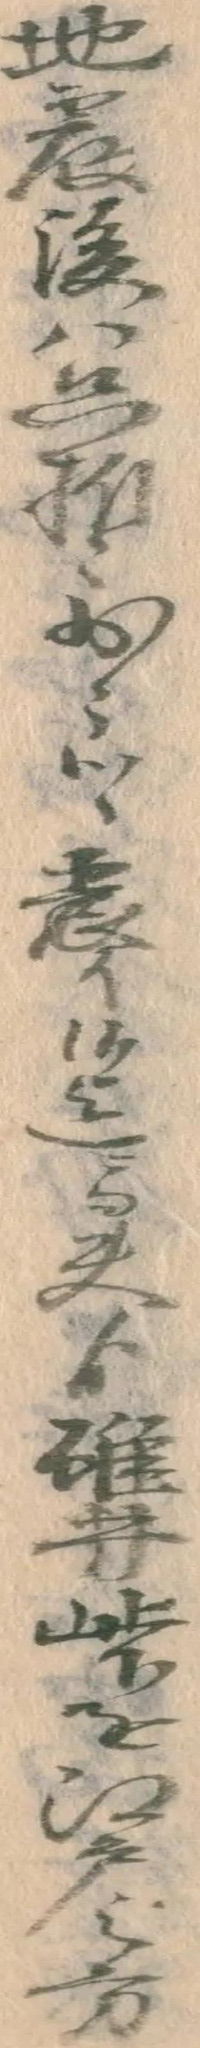地震は只折々少々ツゝ震り候迄ニ而夫ゟ碓水峠ヲ江戸之方
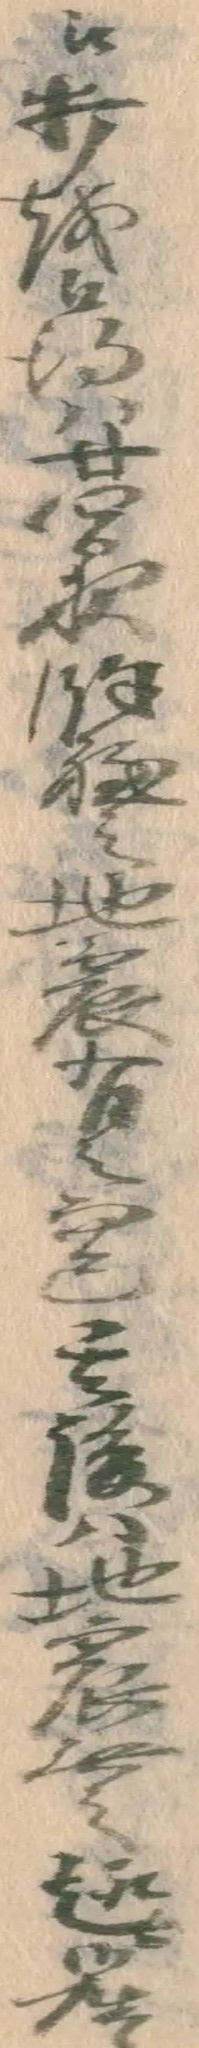江打越候得ハ廿四日夜余程之地震有之而已其後ハ地震無之趣ニ御座候
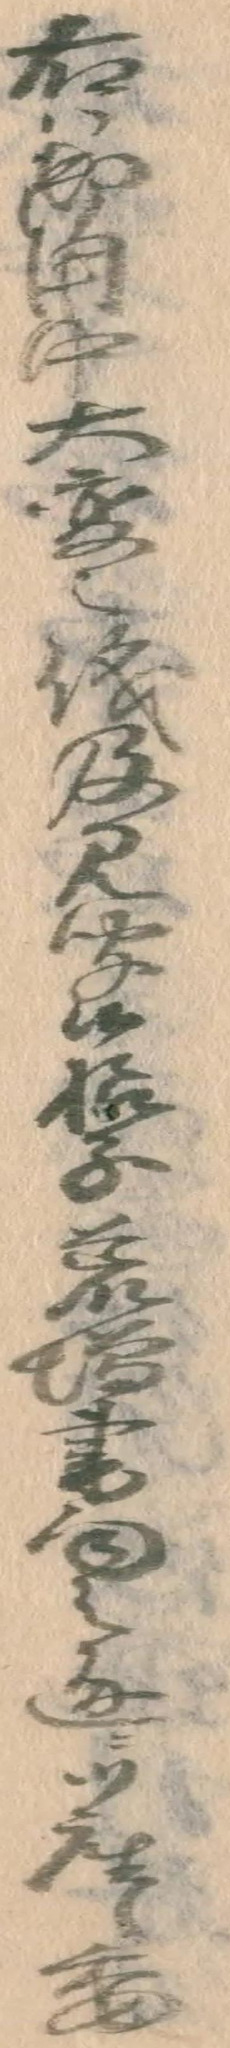右ハ御用中大変之儀及見分候様子荒増書面之通ニ御座候委
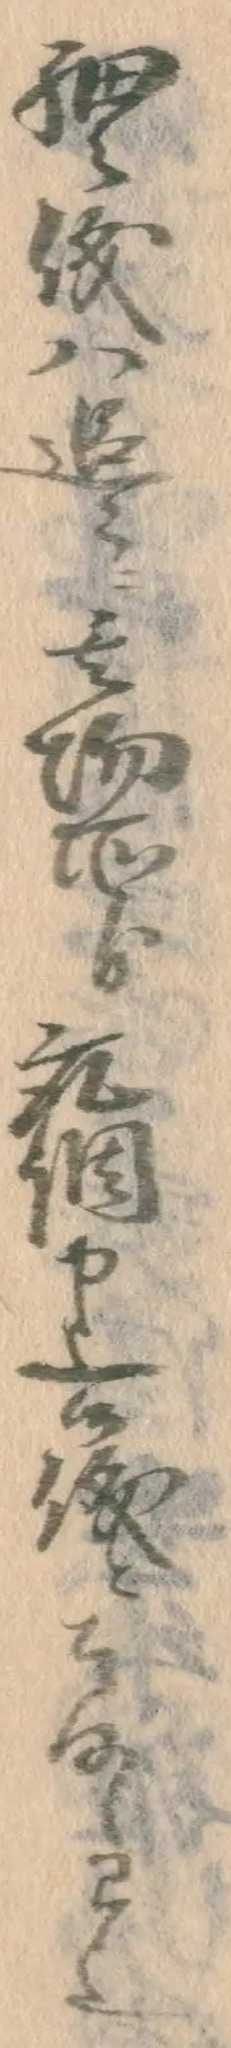細之儀ハ追々場所ゟ取調申上候儀と奉存候已上
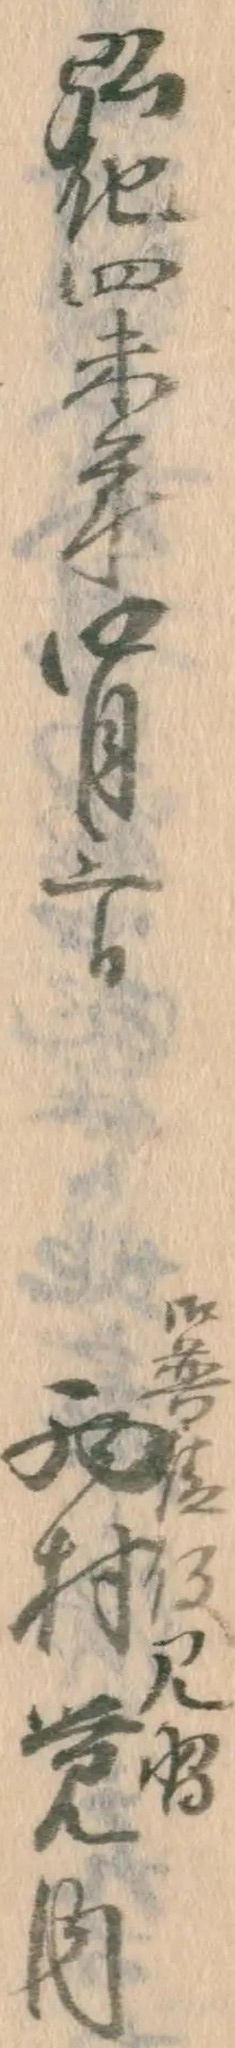弘化四未年四月三日御普請役見習
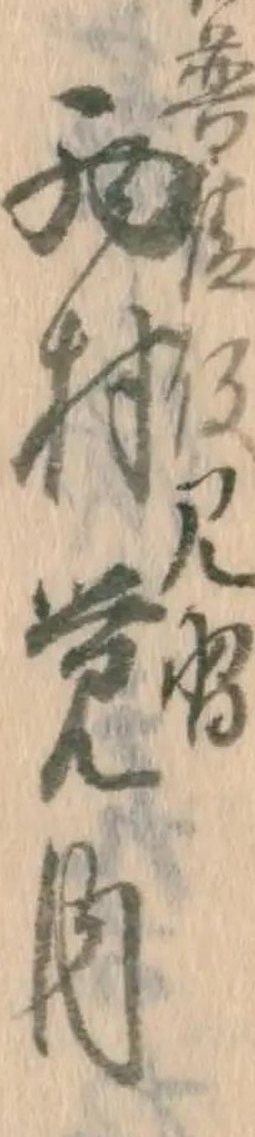西村覚内
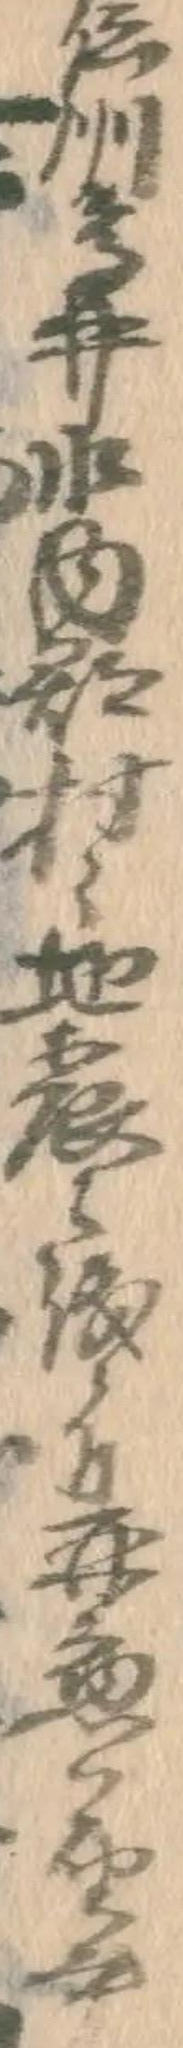信州高井水内郡村々地震之儀二付再応御届
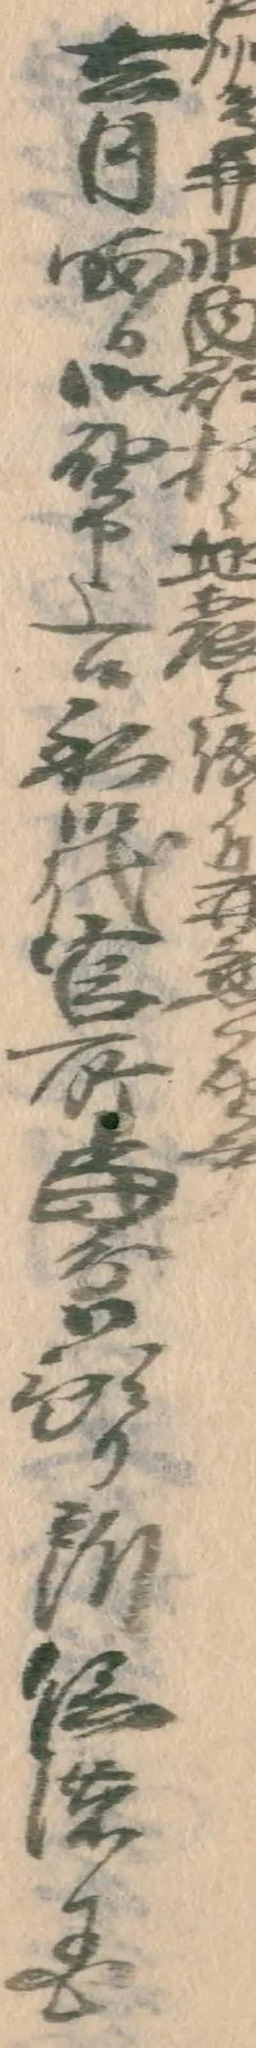去月晦日御届申上候私御代官所当分御預所信濃国
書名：信州大地震之記
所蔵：国立国会図書館 National Diet Library, JAPAN
